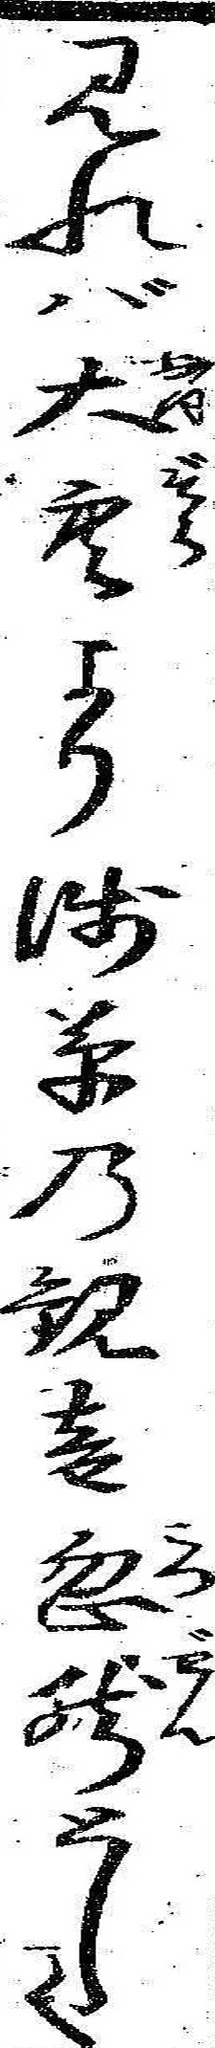見れば大空より浅草の観音忽然としく
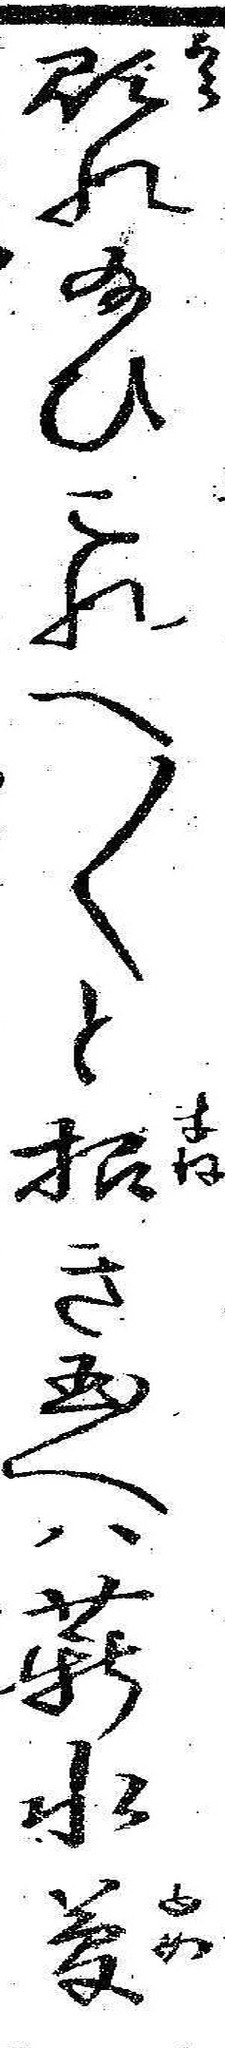顕れ給ひこれへ〱と招き玉へは薪水夢
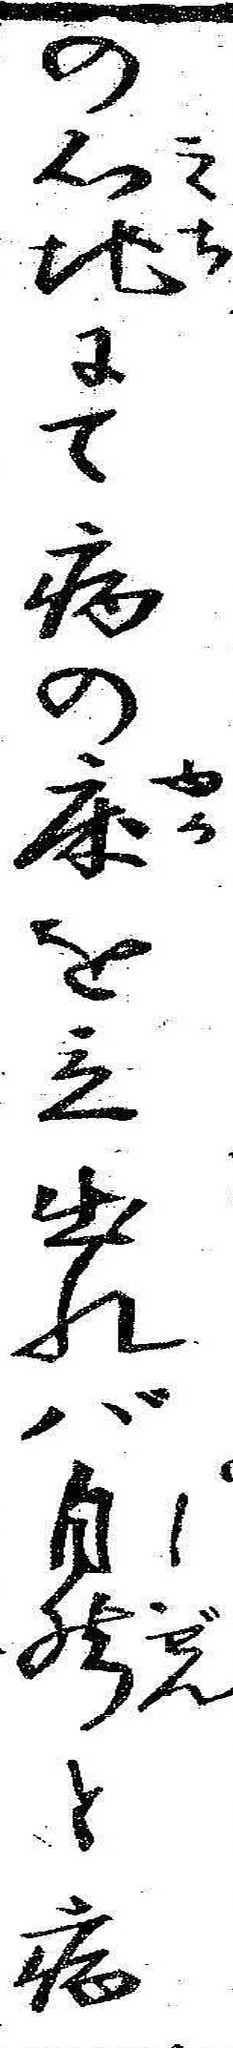の心地にて病の床を立出れば自然と病
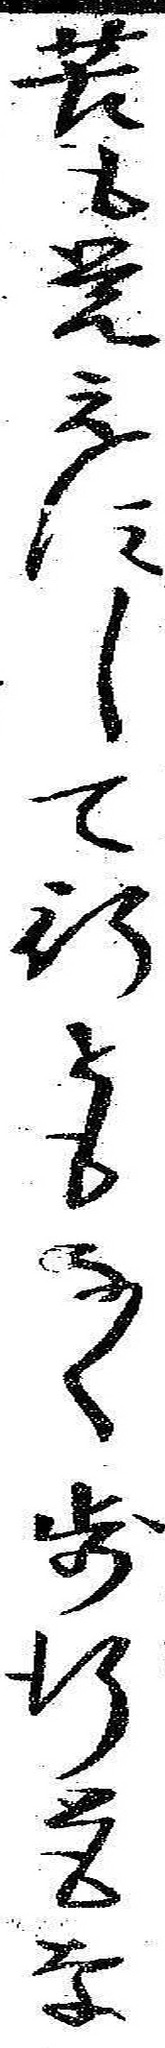苦も覚えすして行ともなく歩行ともな
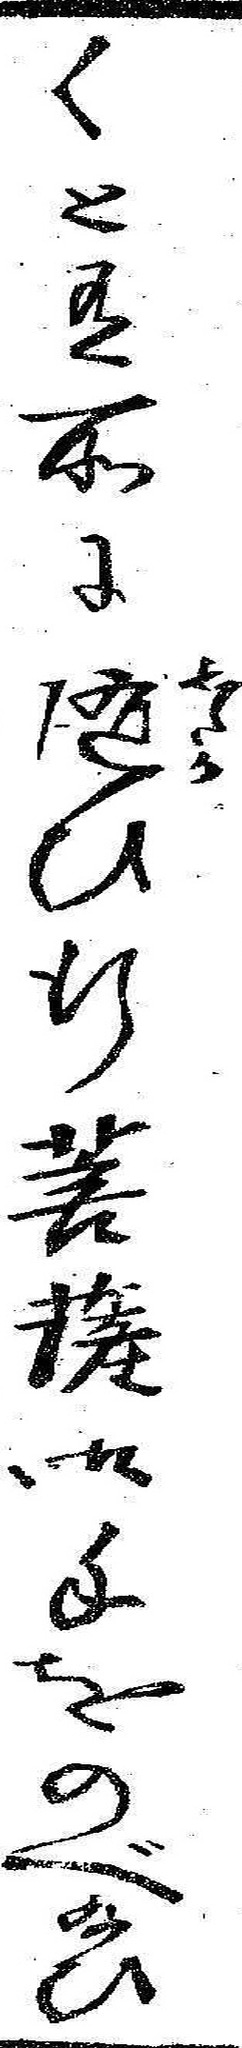くと有所に随ひ行菩薩御手をのべ給ひ
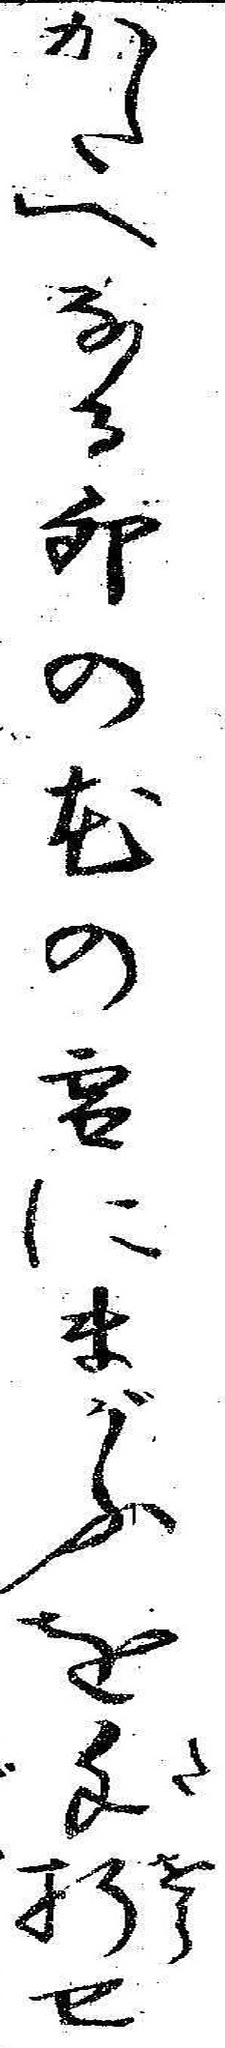かたへなる卯の花の雪にまがふを手折せ
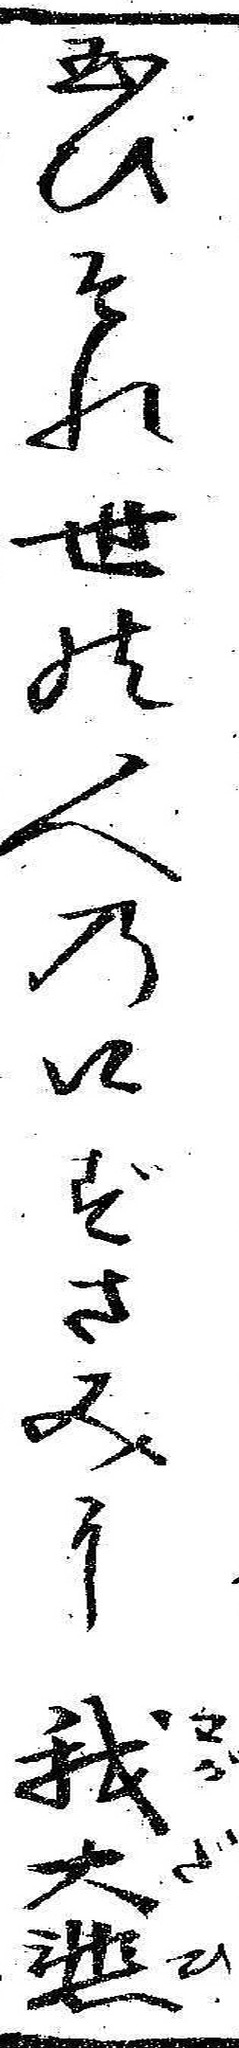玉ひそれ世の人の口ずさみに我大悲
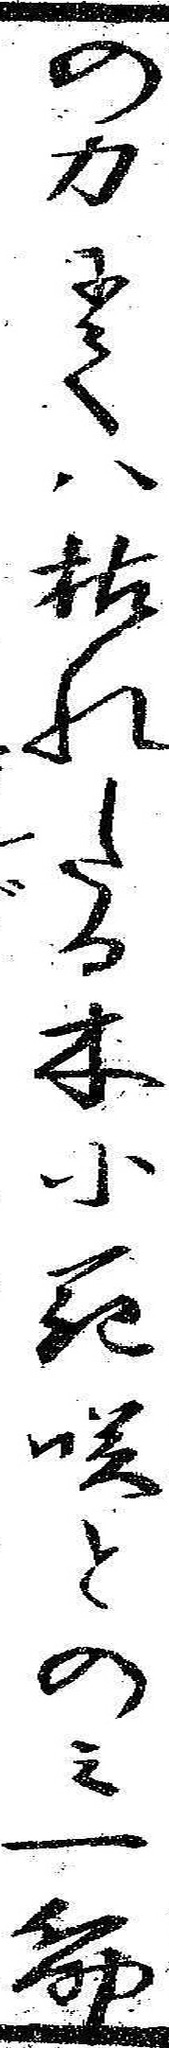の力にては枯れたる木に花咲とのみ一筋
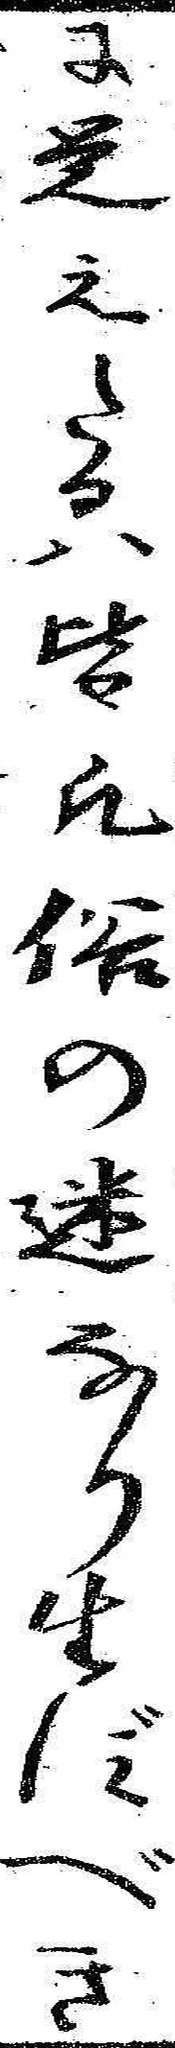に覚えたるは皆凡俗の迷なり生ずべき
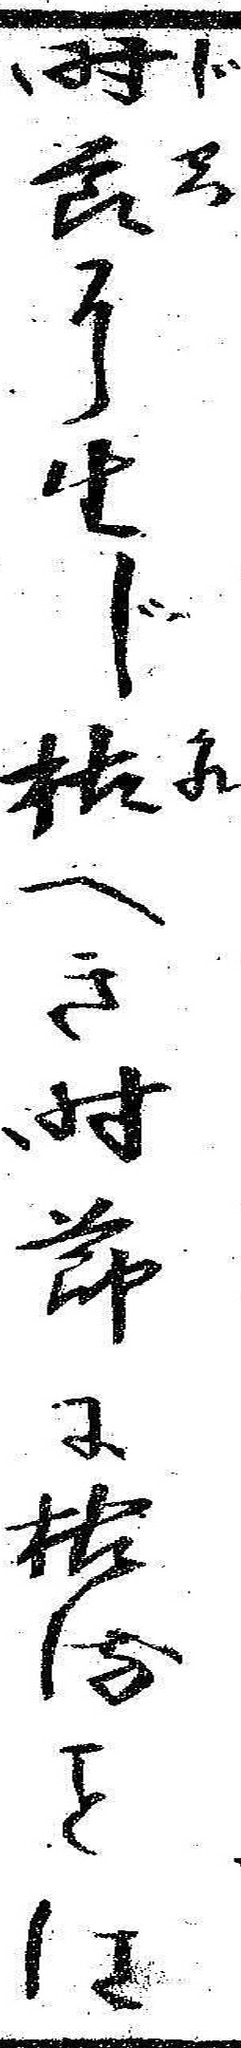時節に生じ枯へき時節に枯ることは

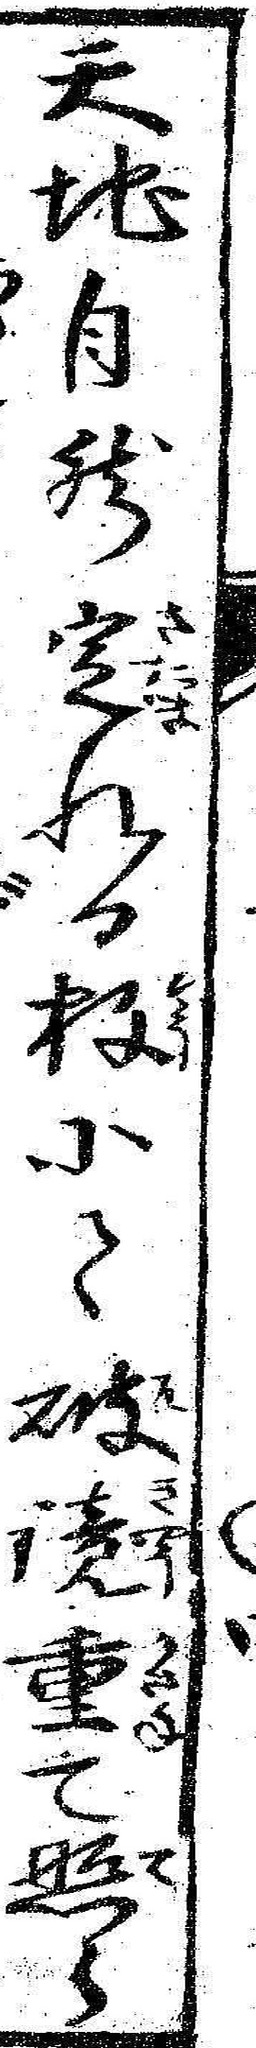天地自然定れる数にて破境重て照ら
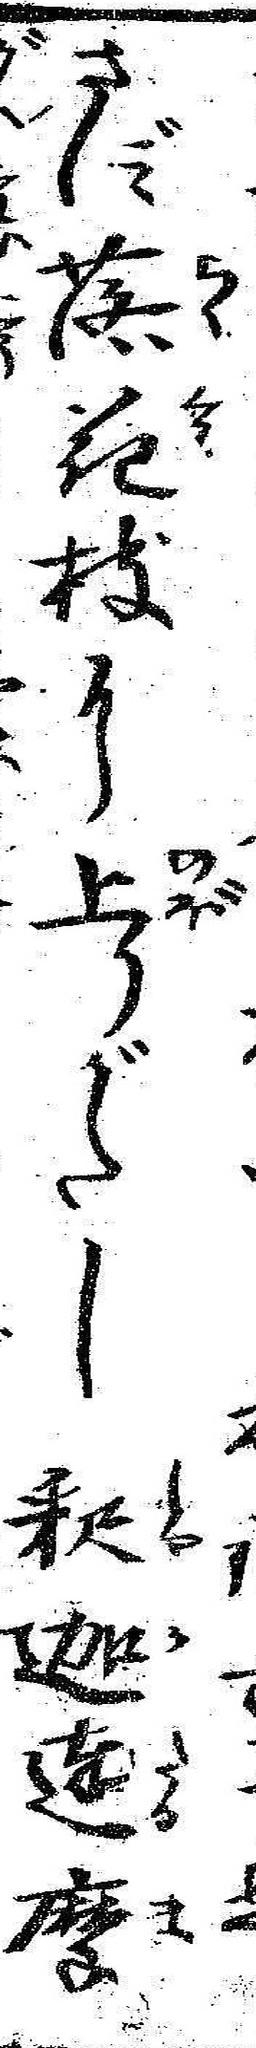さず落花枝に上りがたし釈迦達摩
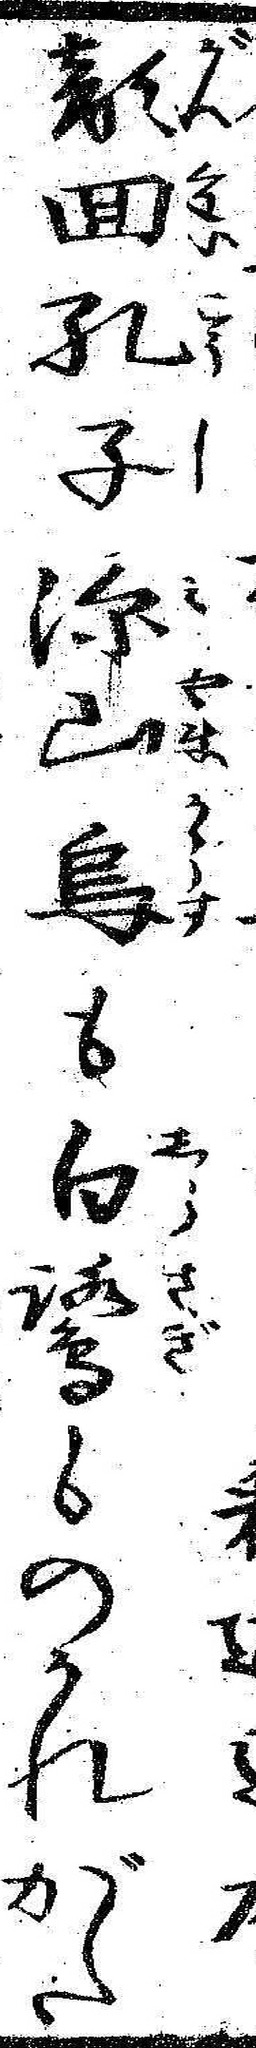顔回孔子深山烏も白鷺ものかれがた
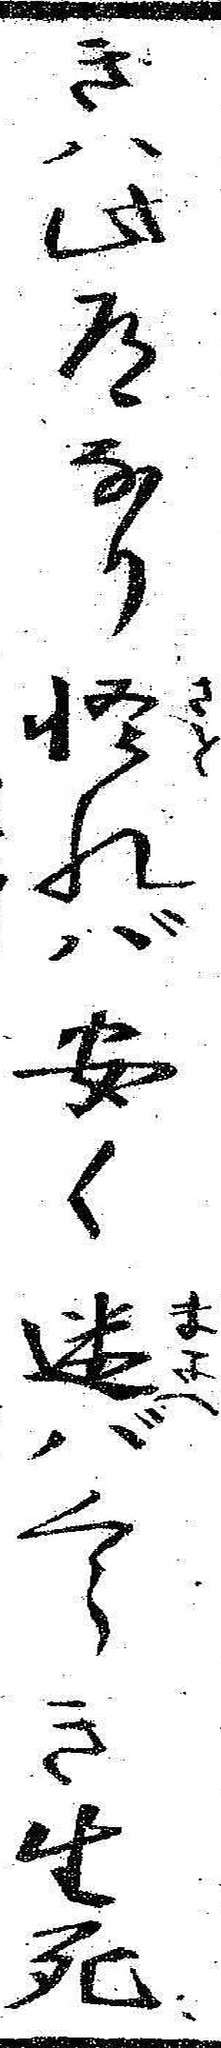きは此道なり悟れば安く迷ばくらき生死
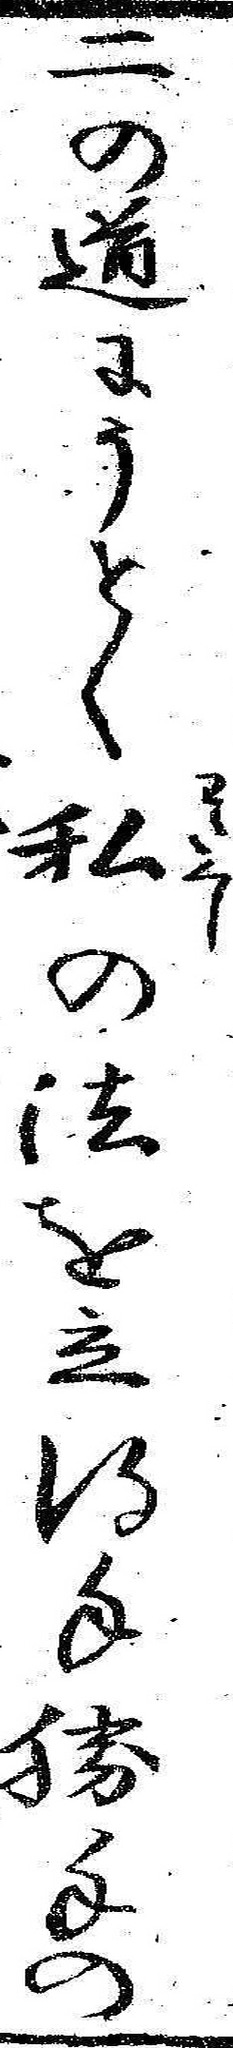二の道にうとく私の法を立得手勝手の
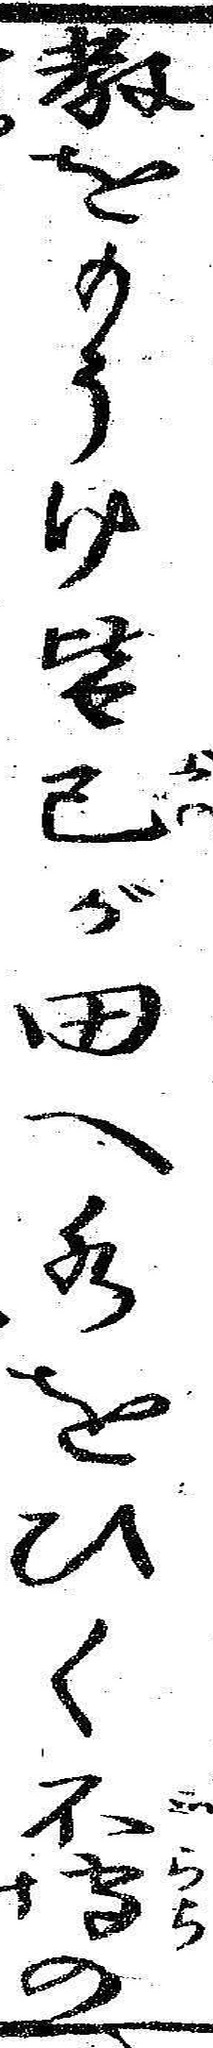教をもうけ皆己が田へ水をひく不埒の
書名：根無草後編
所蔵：国文学研究資料館
